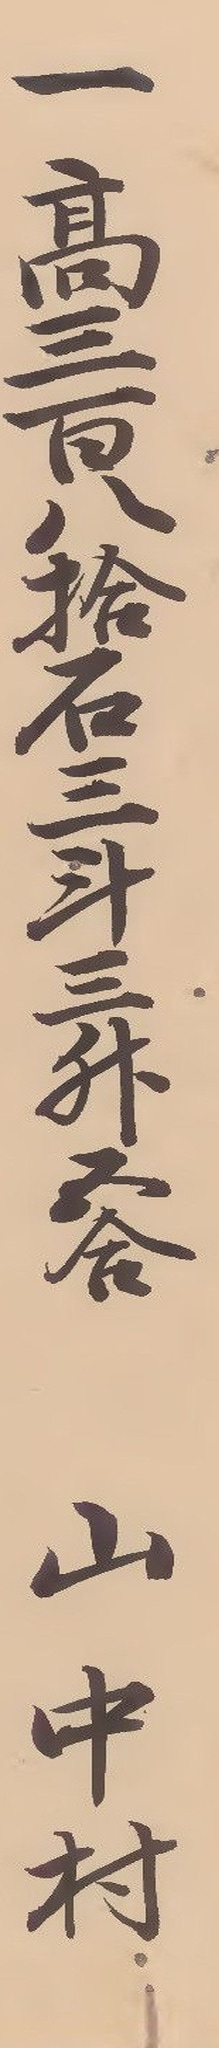一高三百八拾石三斗三升五合山中村
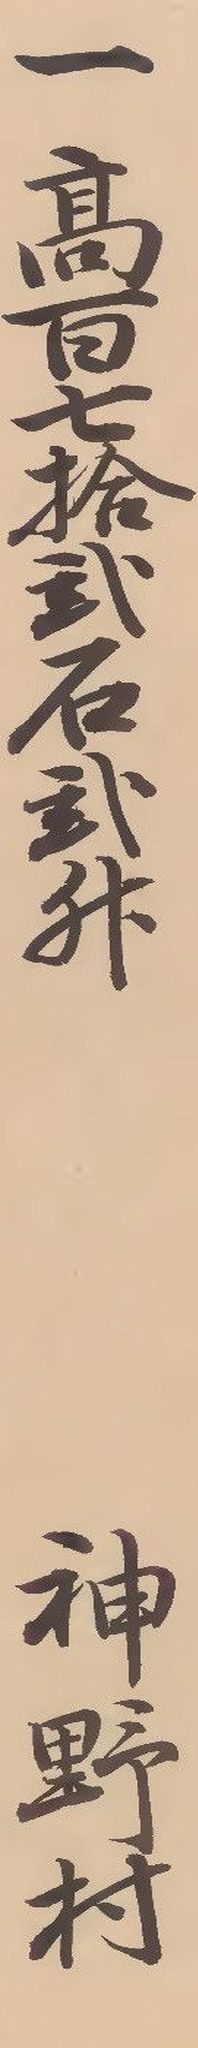一高百七拾弐石弐升神野村
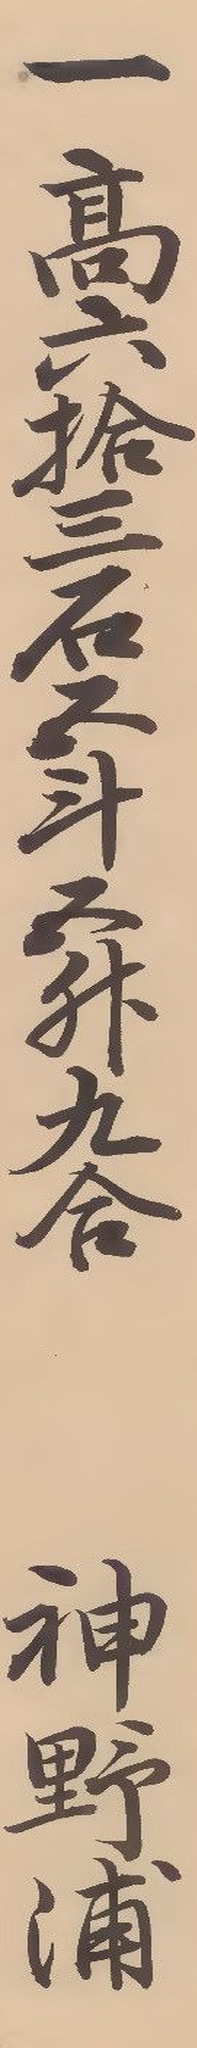一高六拾三石五斗五升九合神野浦
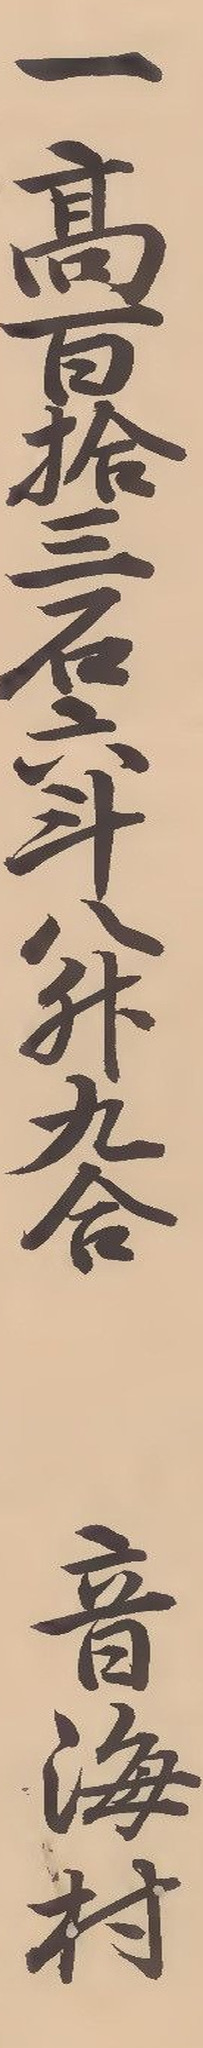一高百拾三石六斗八升九合音海村
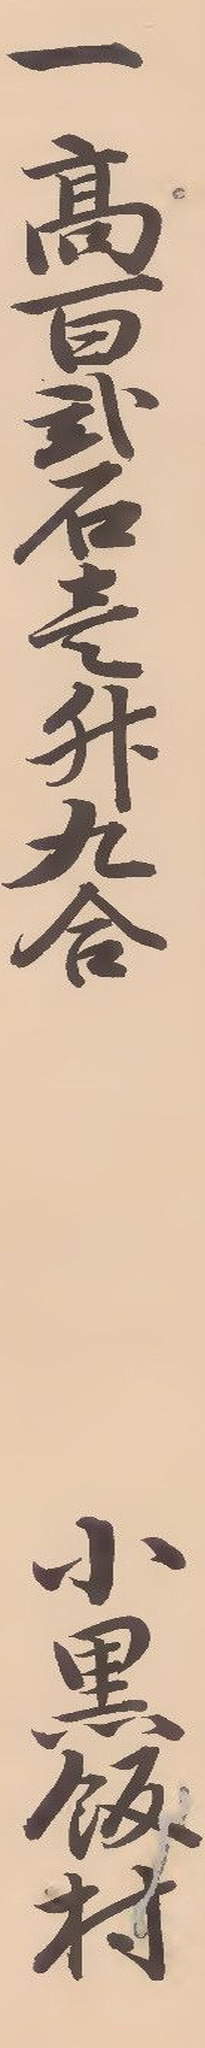一高百弐石壱升九合小黒飯村
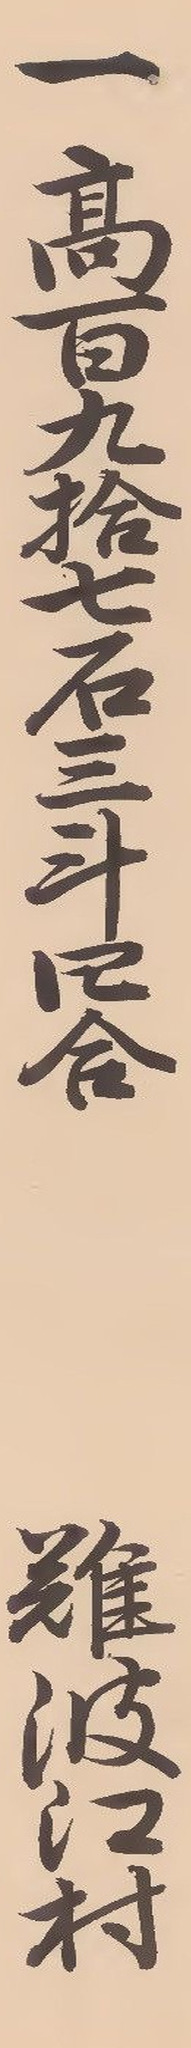一高百九拾七石三斗四合難波江村
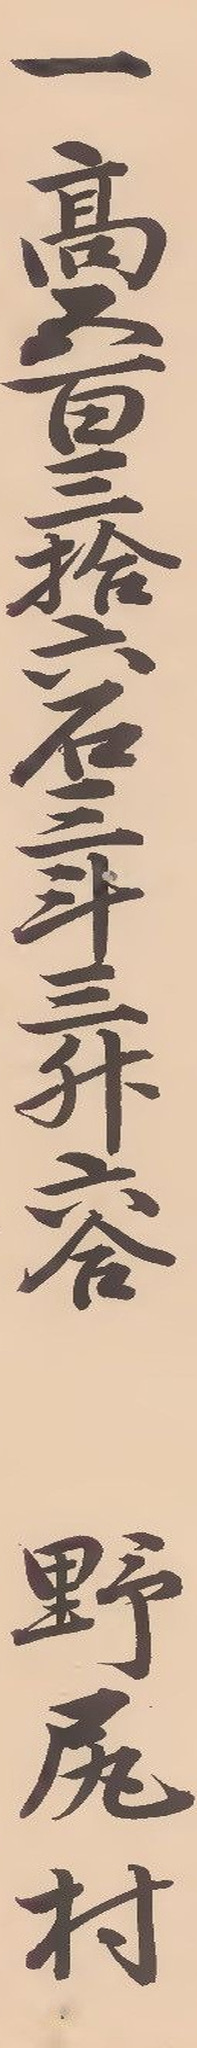一高五百三拾六石三斗三升六合野尻村

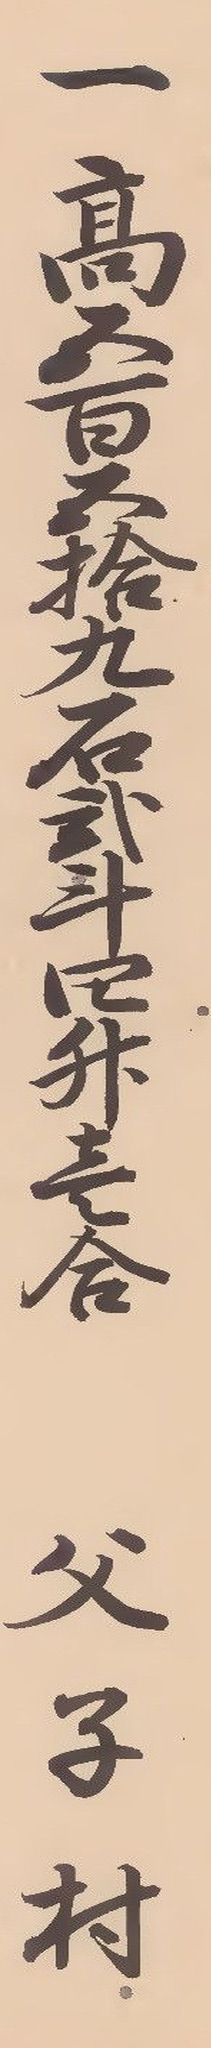一高五百五拾九石弐斗四升壱合父子村
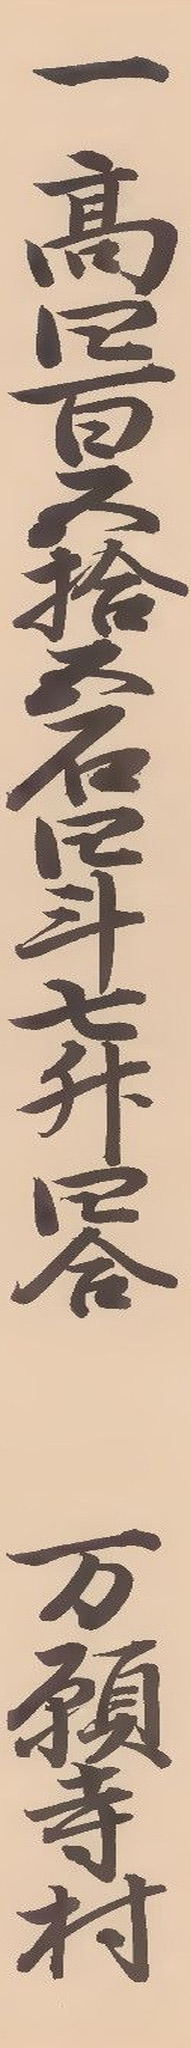一高四百五拾五石四斗七升四合万願寺村
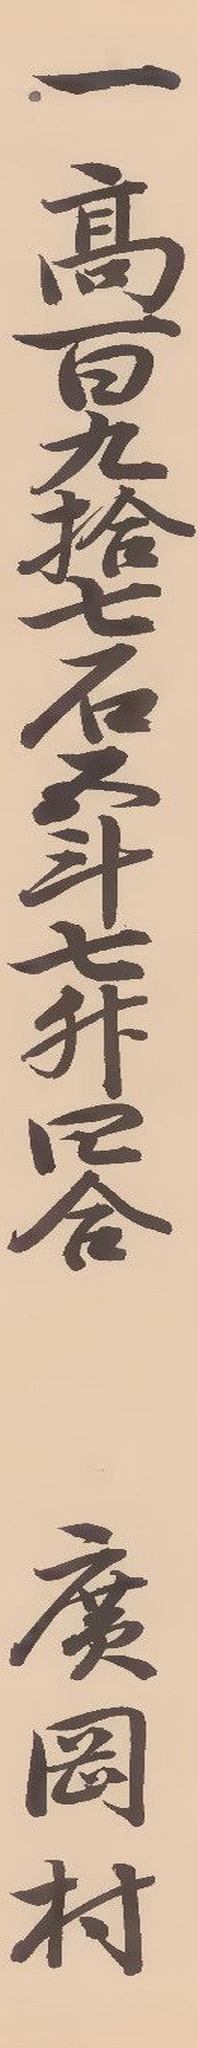一高百九拾七石五斗七升四合広岡村
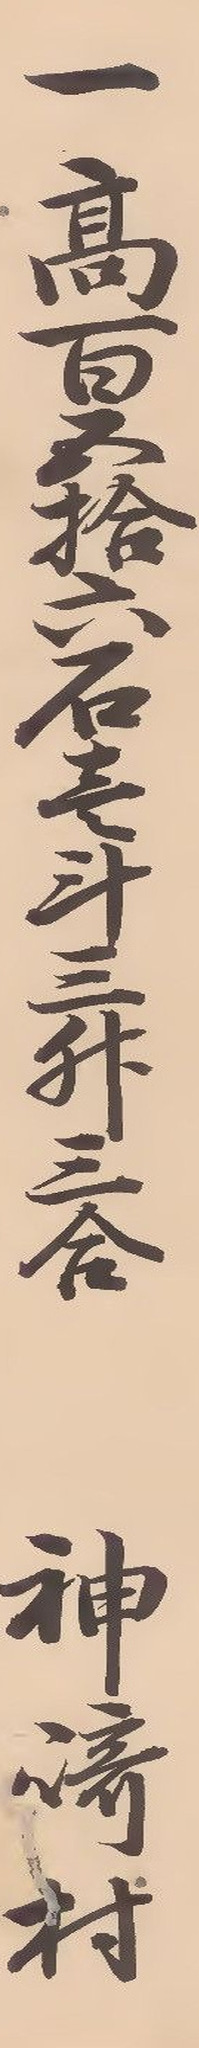一高百五拾六石壱斗三升三合神崎村
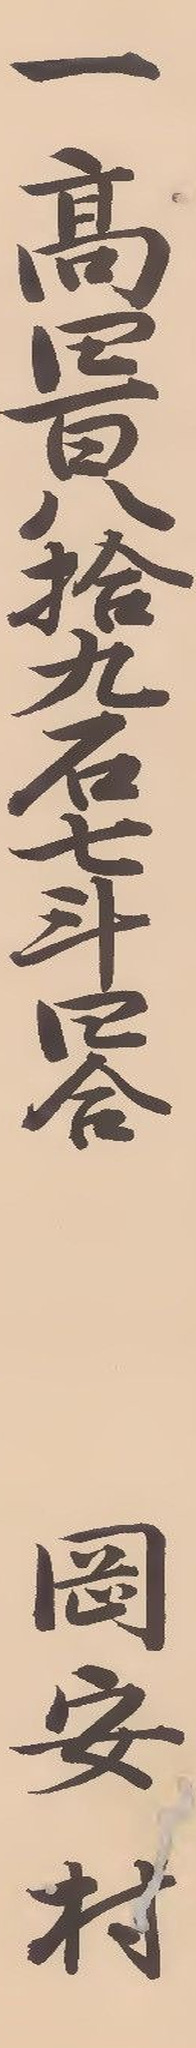一高四百八拾九石七斗四合岡安村
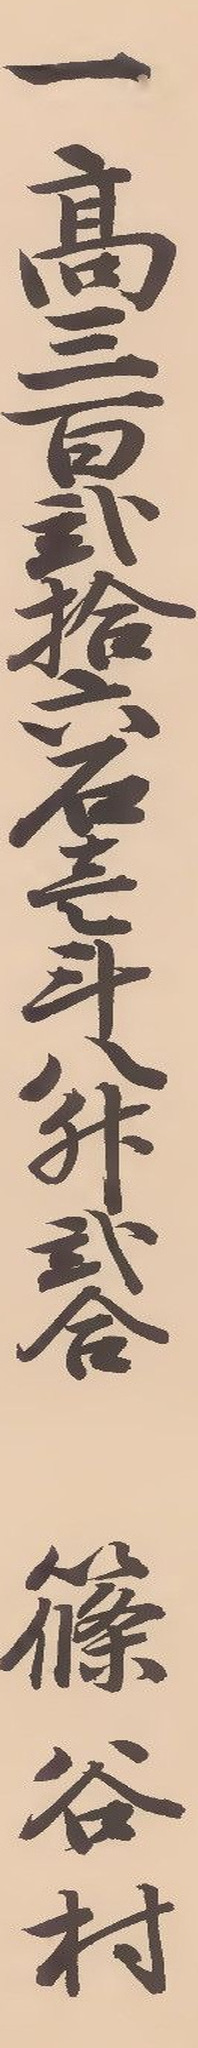一高三百弐拾六石壱斗八升弐合篠谷村
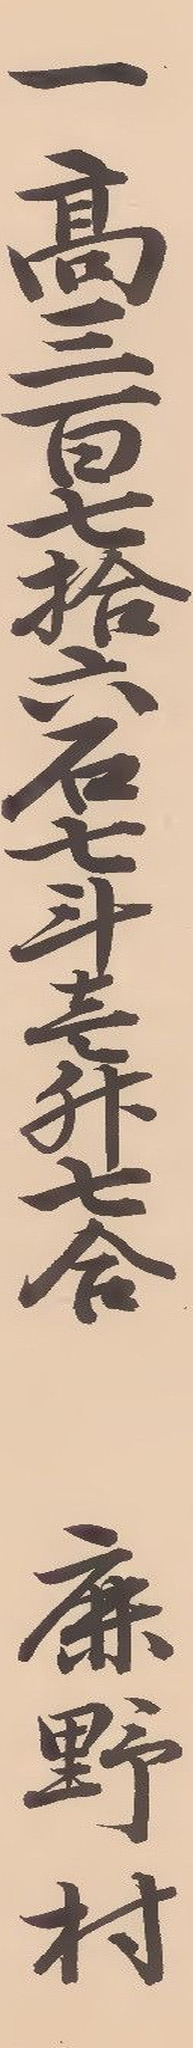一高三百七拾六石七斗壱升七合鹿野村
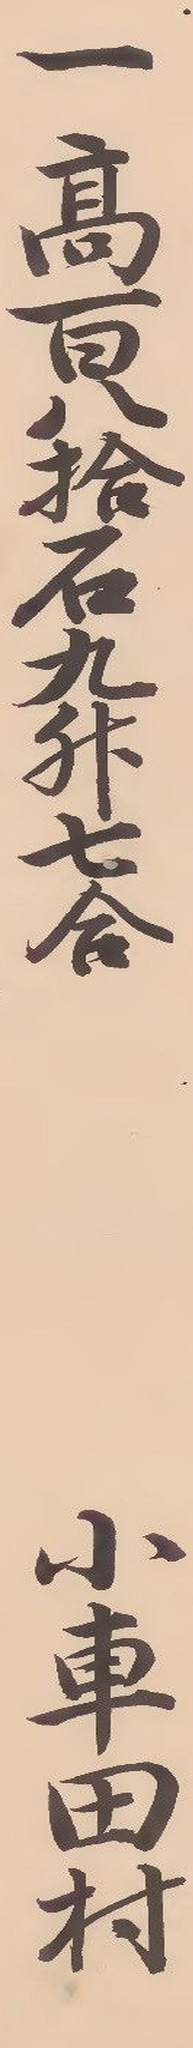一高百八拾石九升七合小車田村

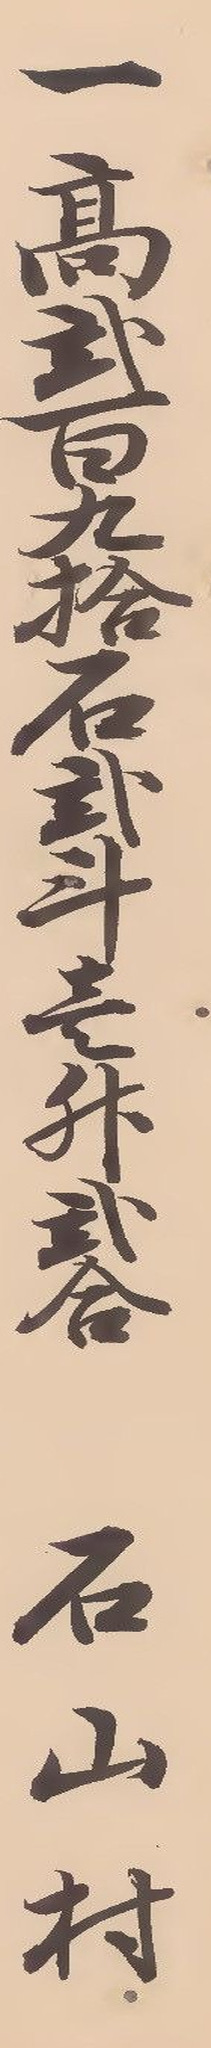一高弐百九拾石弐斗壱升弐合石山村
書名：若狭国郷帳
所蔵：国立公文書館 National Archives of Japan
